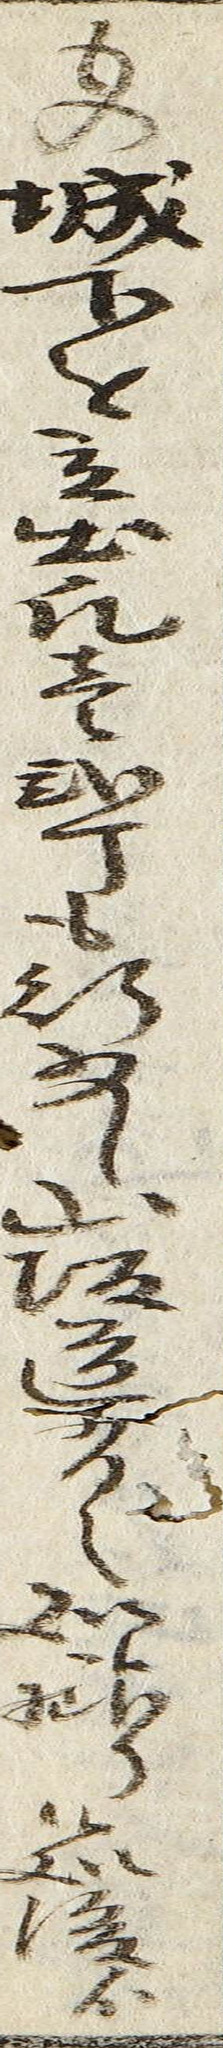もの城下を立出凡壱弐丁も行少し山坂道有之処江掛り候処後ゟ
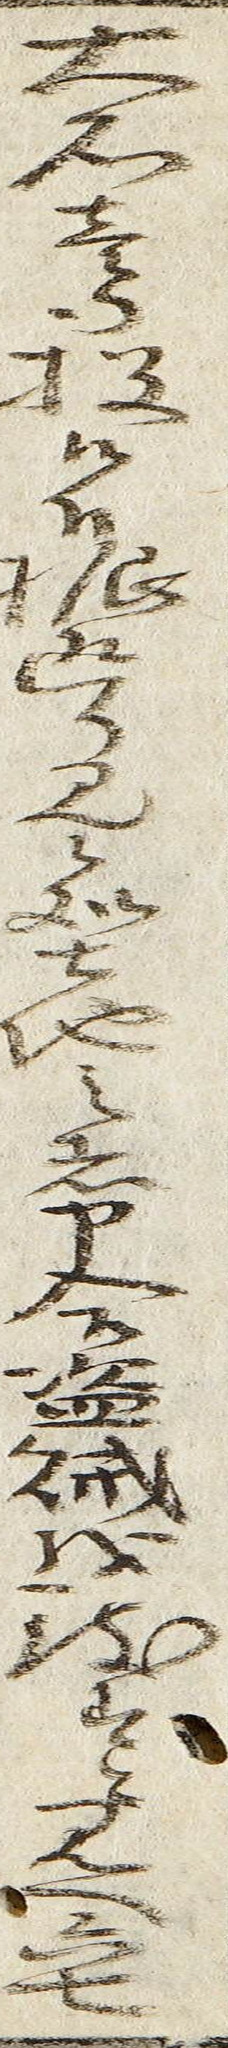大石壱つ投候付振返り見候処土地之者申合盗賊を致すと見へ六七
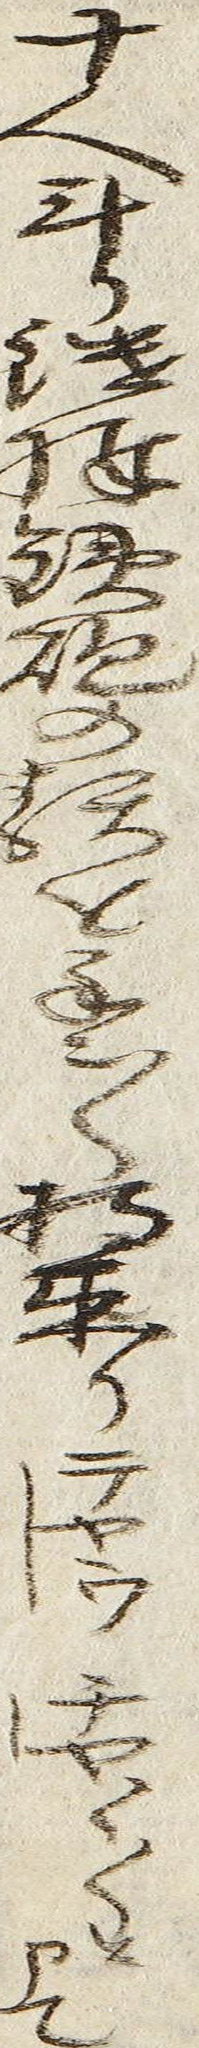十人計り鑓棒鉄砲の類を手に〳〵持来りテヤウチヤ〳〵〳〵と申て
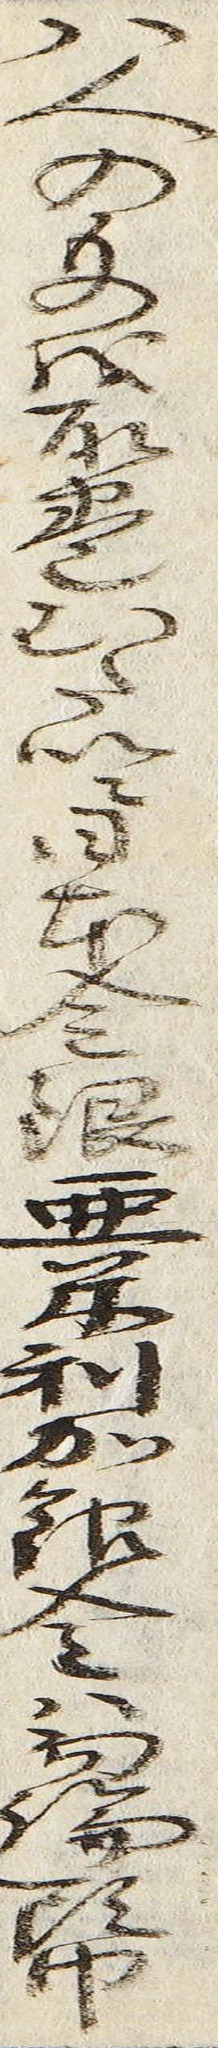八人のものを取巻むたいに日本金銀亜米利加銀金は勿論頭巾
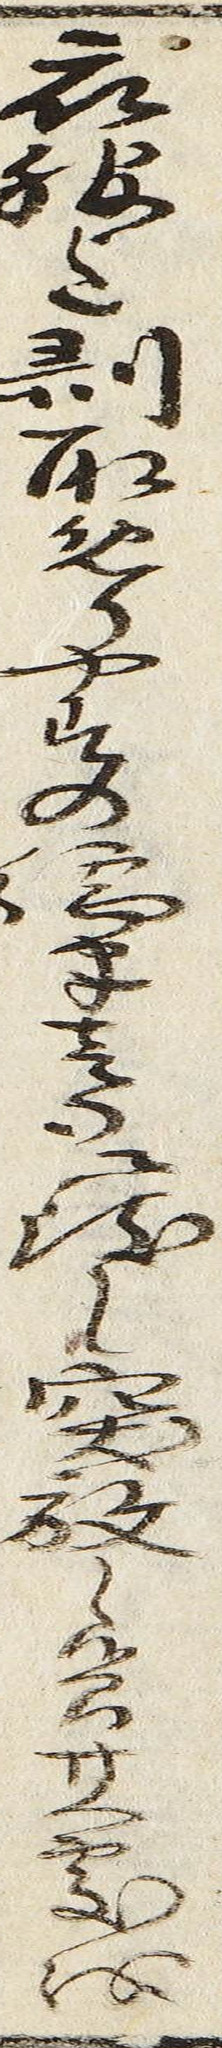衣服迄剥取めりやすの襦半壱つに致し突放し候間其処を
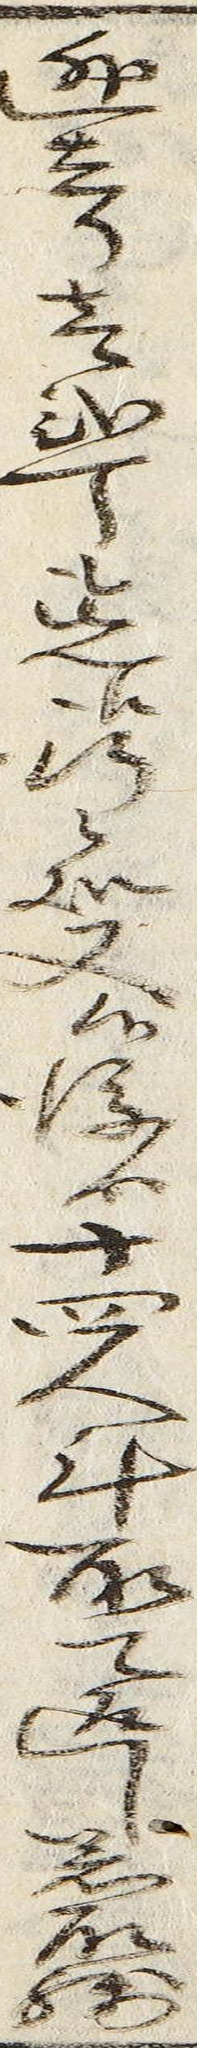逃去り壱弐丁も先江行候処又候後ゟ十四人計取て返し若し取残
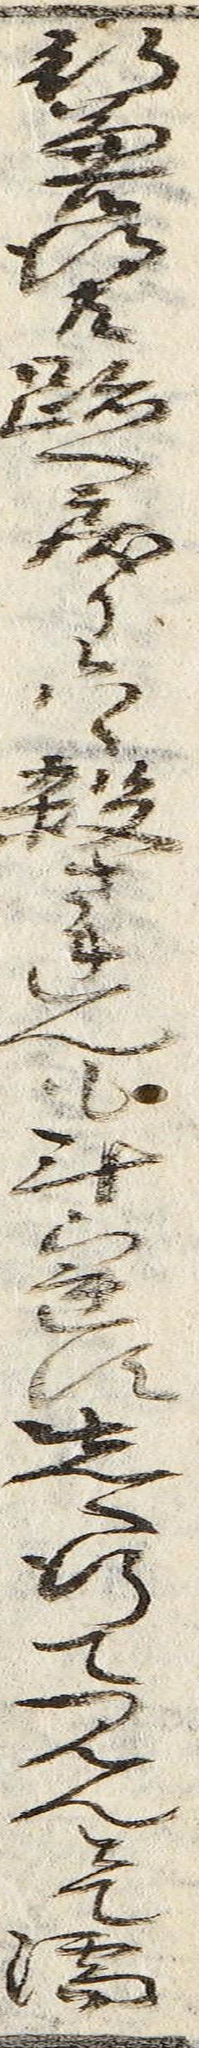行兼候得共跡へ戻り候はゝ殺されんも計られす先へ行きて見んとて濡
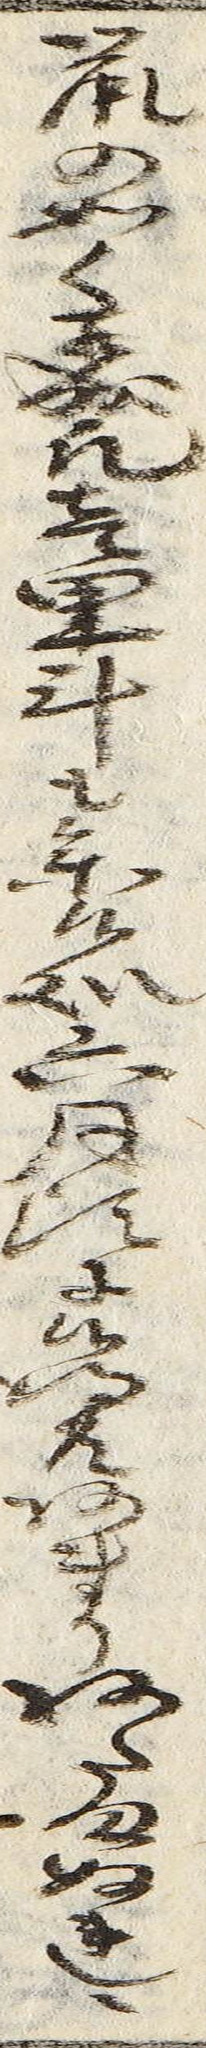鼠の如く相成凡壱里計も参候処六月頃に候得共あまりあたまぬれに
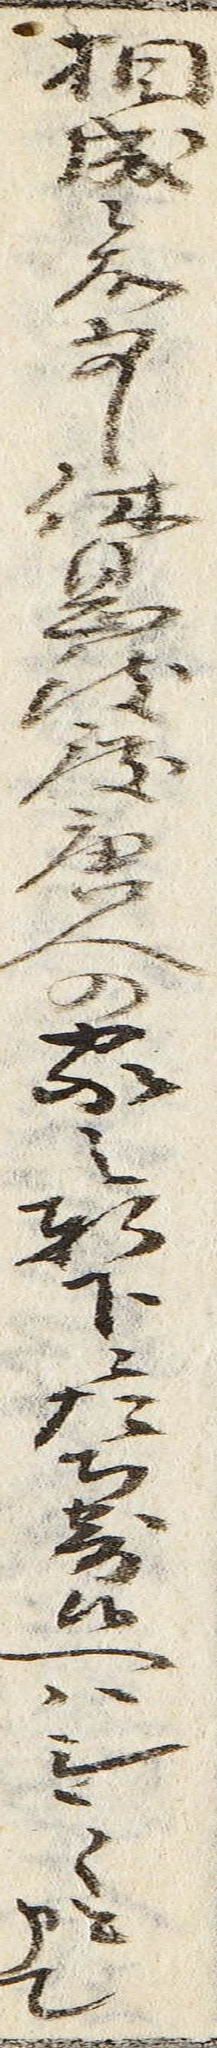相成候故少し休息致度唐人の家之軒下にたち寄候へはしゝ〳〵と申て
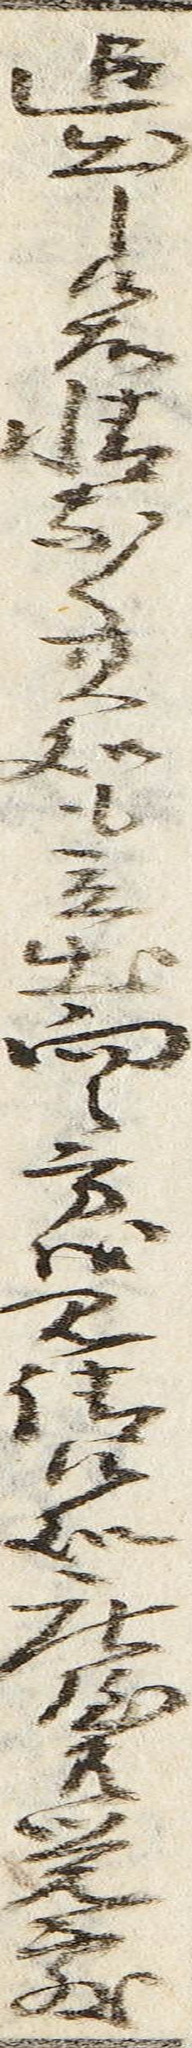追出し候故情なく其処も立出向之方を見請候処庄屋共覚敷
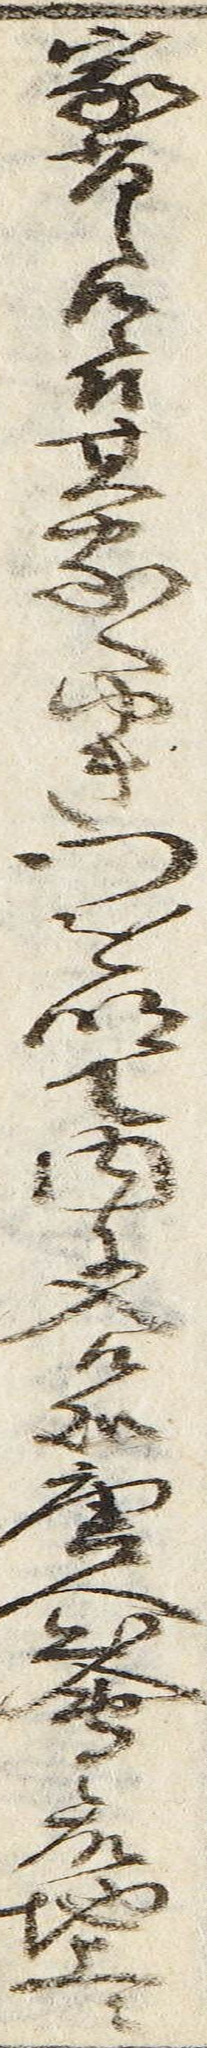家有之候に付其家へゆき門を明て内に入候処唐人出会候故地上に
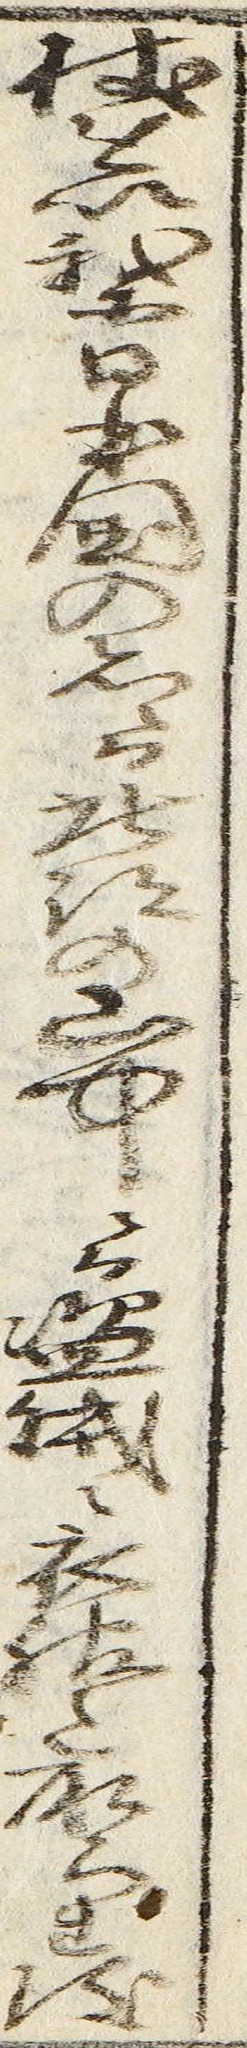杖を以我等日本国の者に而此跡の山中に而盗賊に衣服を取られ致
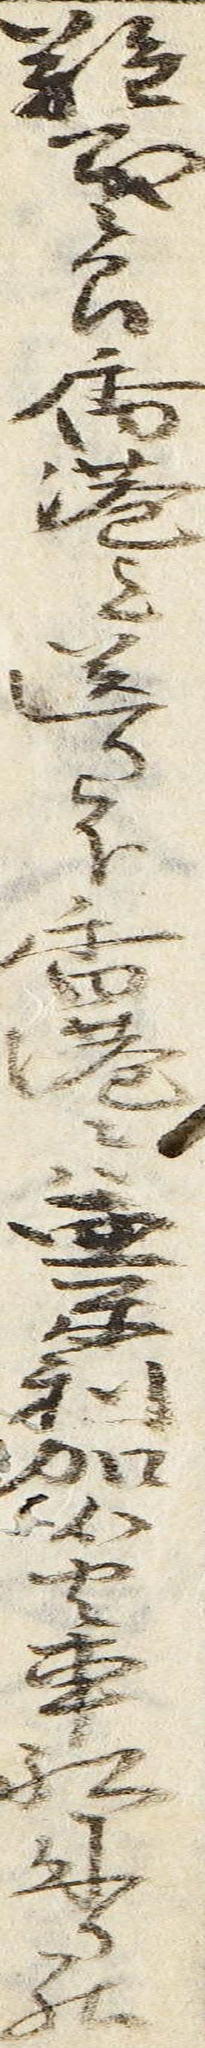難義候間香港迄送り被下香港には亜米利加より火車船来り罷
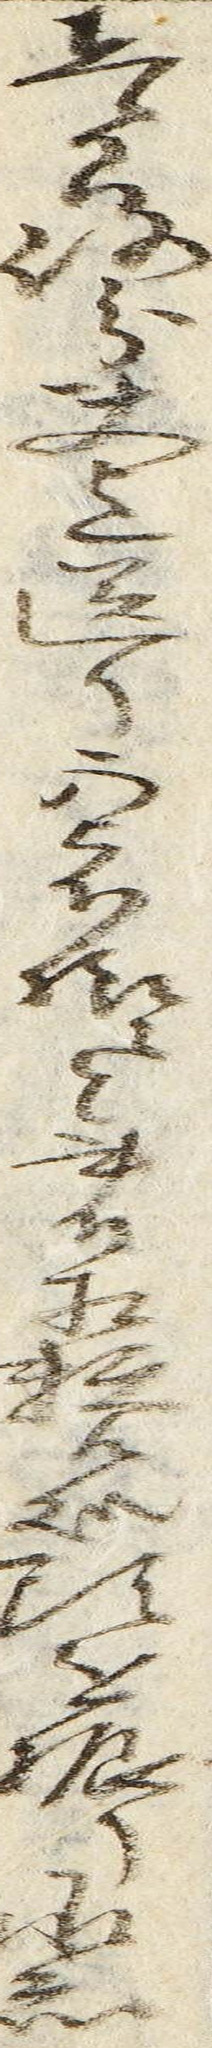在候間何分夫迄送り可被下様にと書付相頼候処頭を振り承知
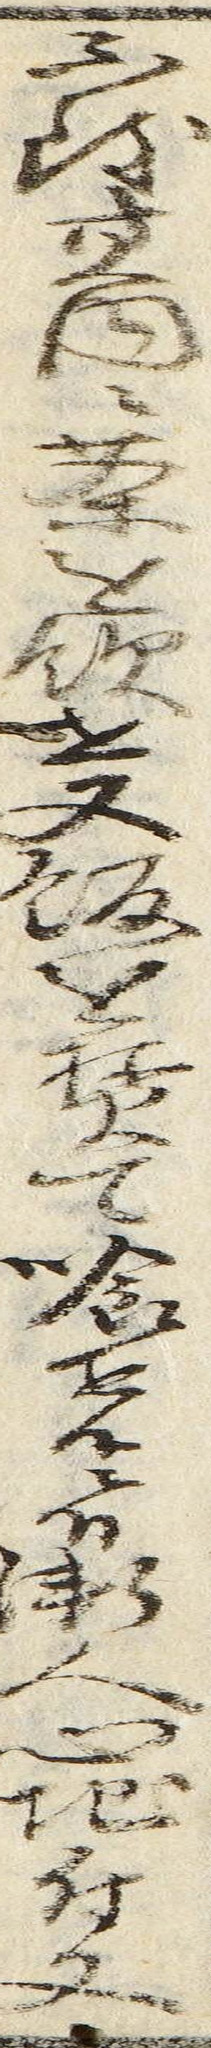不致其内に茶を飲せ又飯を焚て喰せ候に付漸人心地付又

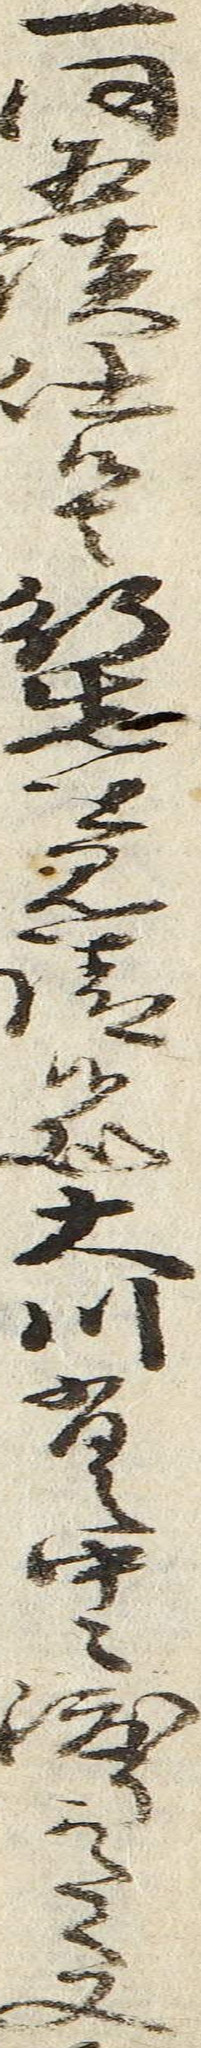一同相談仕候者行先を見請候処大川有之中々渡りかたく又
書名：漂流夢物語
